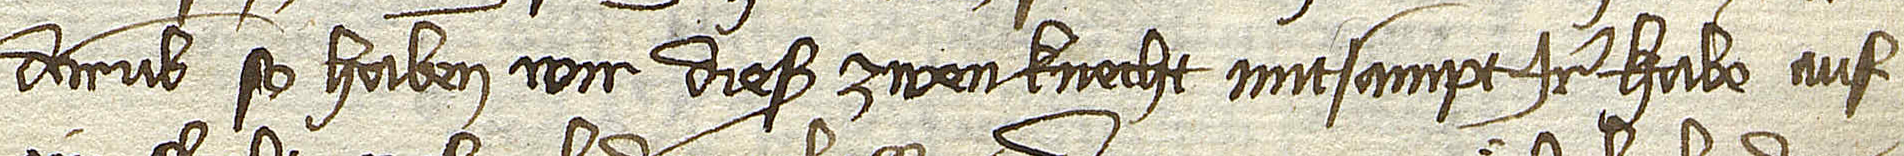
daru*b ſo haben wir dieſ* ʒwen knecht mitſampt Ir* habe auf
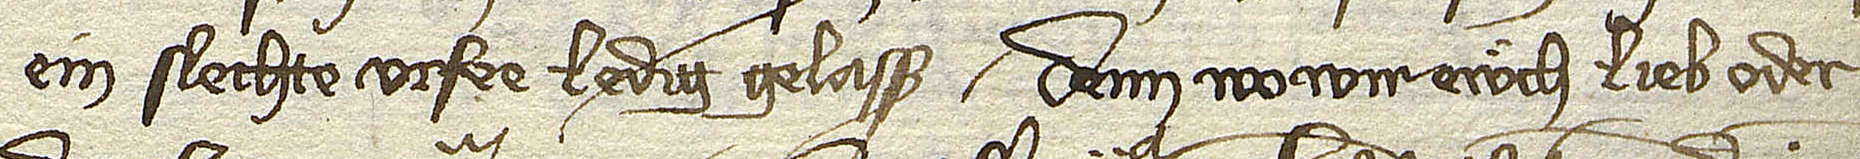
ein ſlechte vrfee ledig gelaſſ* / Denn wo wir ewch lieb oder
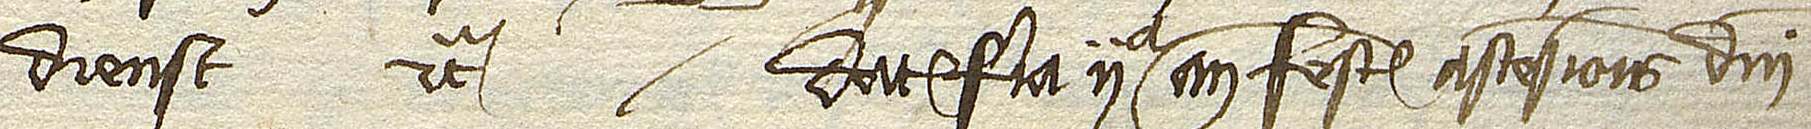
dienſt ec* / Dat* fia* an* feſt* aſce*ſion*s dni*
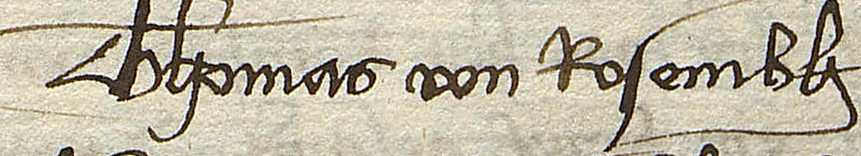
Thomas von Roſemb*g
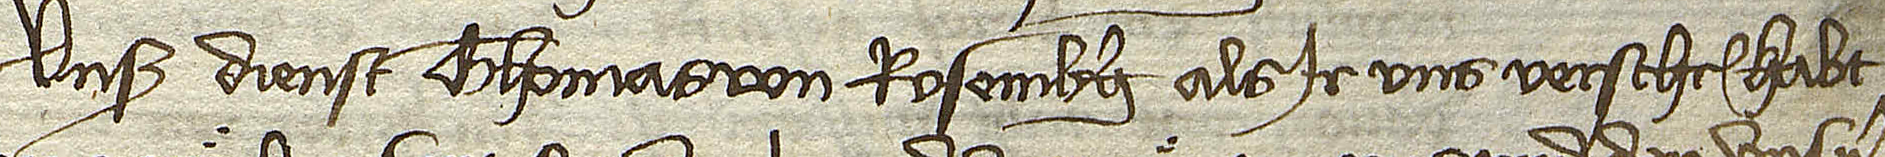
Vnſ* dienſt Thomas von Roſemb*g als Ir vns verſchr* habt
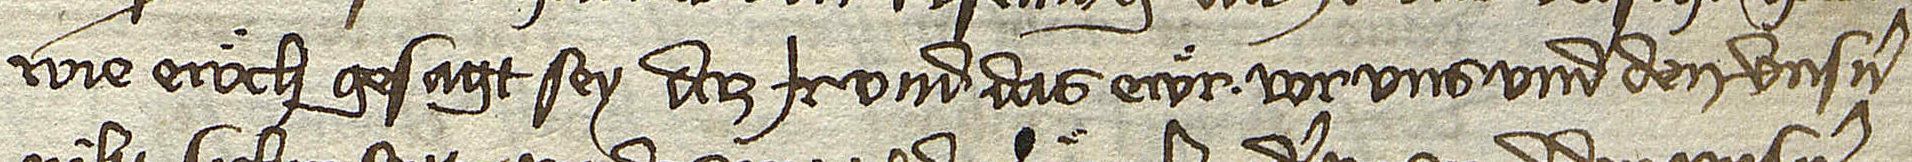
wie ewch geſagt ſey daʒ Ir vnd das ewr . vor vns vnd den Vnſ*n
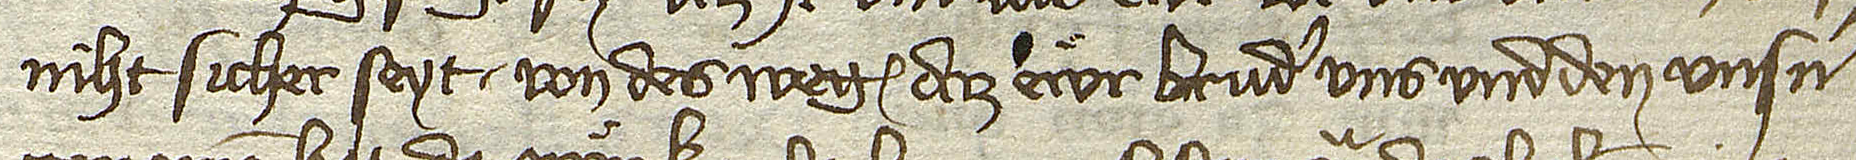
niht ſicher ſeyt . von des weg* daʒ ewr brud* vns vnd den vnſ*n
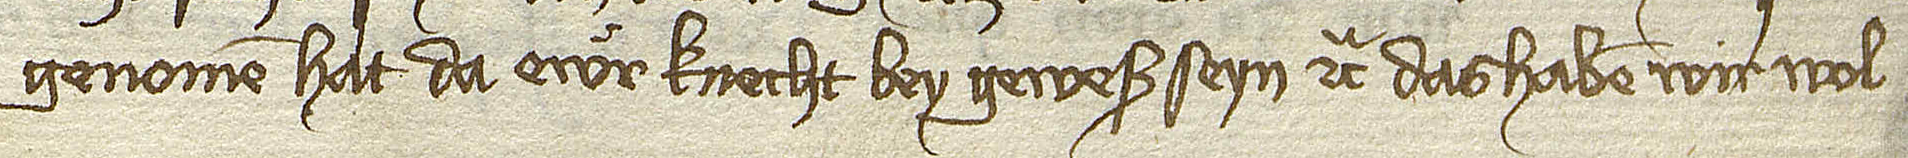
genome* hat da ewr knecht bey geweſ* ſeyn ec* das habe* wir wol
